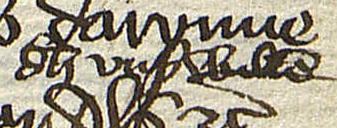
d*h* vnſ* wille*
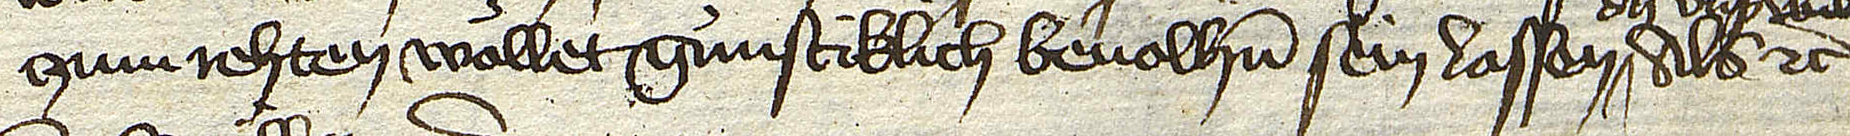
cʒum rehten wöllet günſtiklich beuolh*n ſein laſſen Als ec*
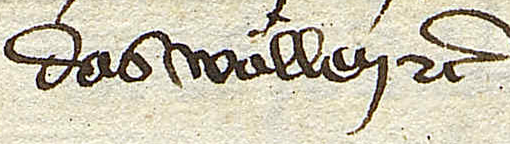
das wöllen ec*
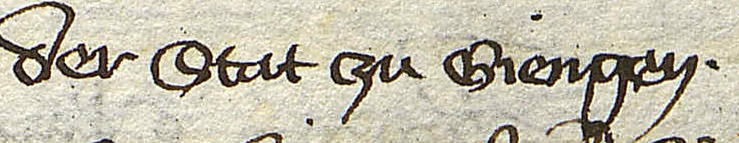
Der Stat cʒu Giengen
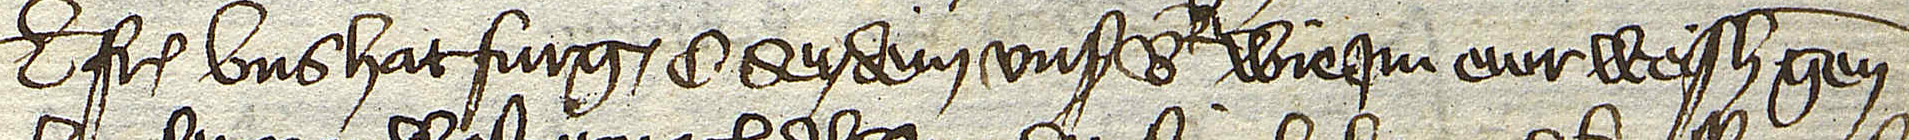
L* fr* Vns hat furg* C . Seydein vnſ* B* wie Im ewr weiſh* gen
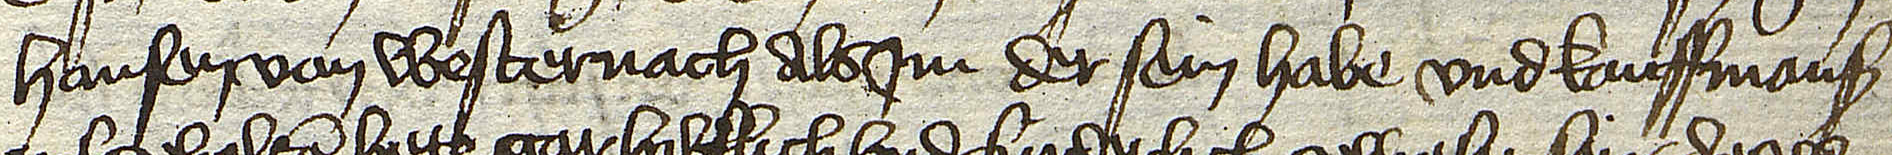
hanſen von weſternach Als Im der ſein habe vnd kauffmanſ*
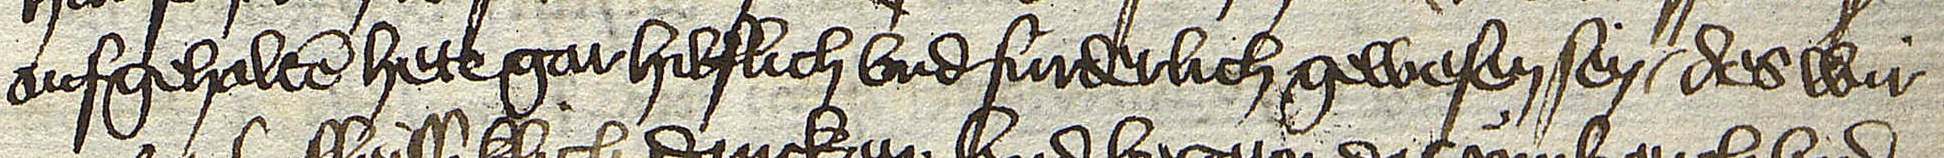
aufgehalte* hete gar hilflich vnd fürderlich geweſen ſey / des wir
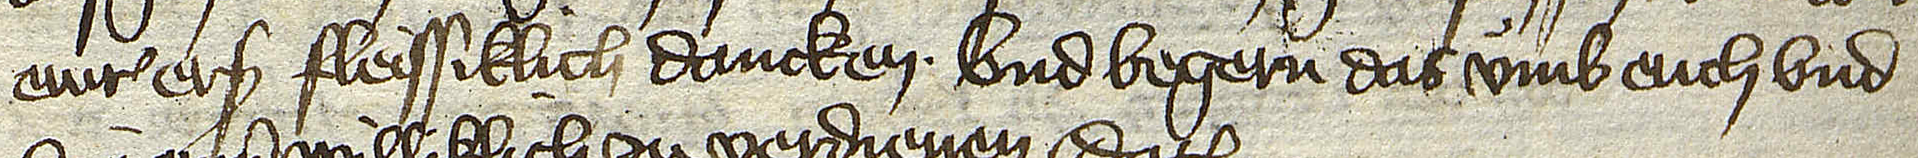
ewr erſ* fleiſſiklich dancken . vnd begern das v̈mb euch vnd
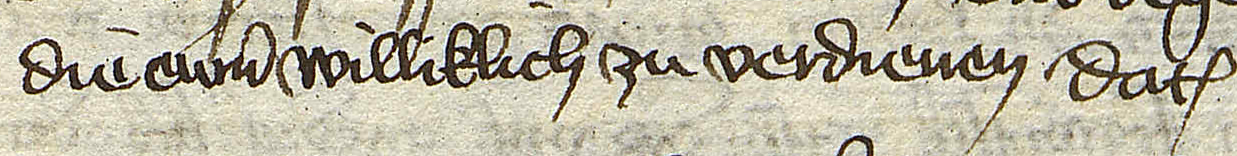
die ew*n williklich cʒu verdienen / dat*
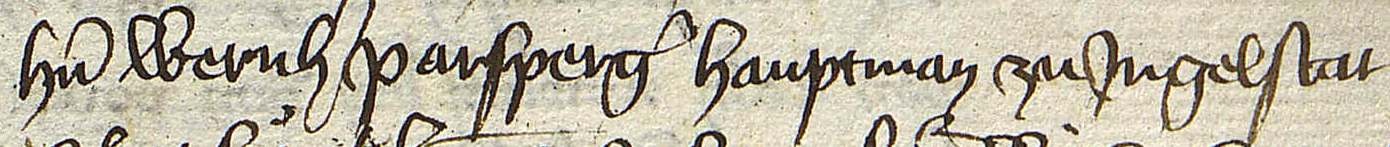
h*n Wernh* parſperg* hauptman cʒu Ingelſtat
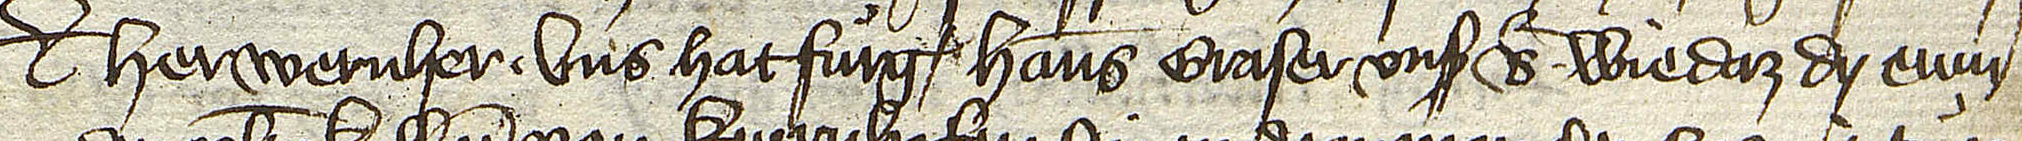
L* her wernher . vns hat fürg* hans* Graſer vnſ* B* . wie daʒ dy ew*n
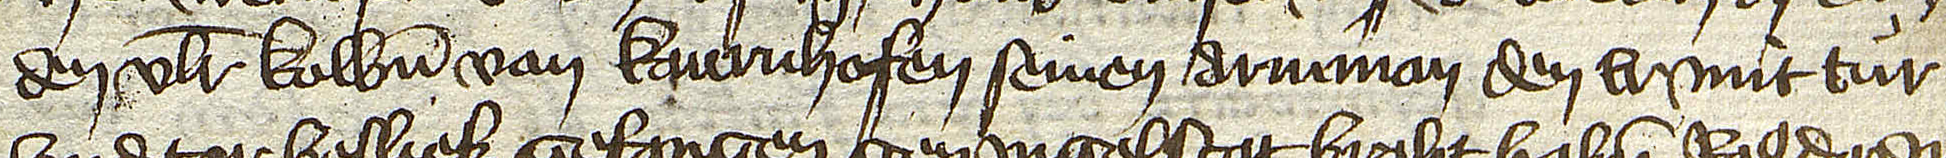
den vlr* kalb*n von kaurnhofen ſeinen Armman den Er mit tür
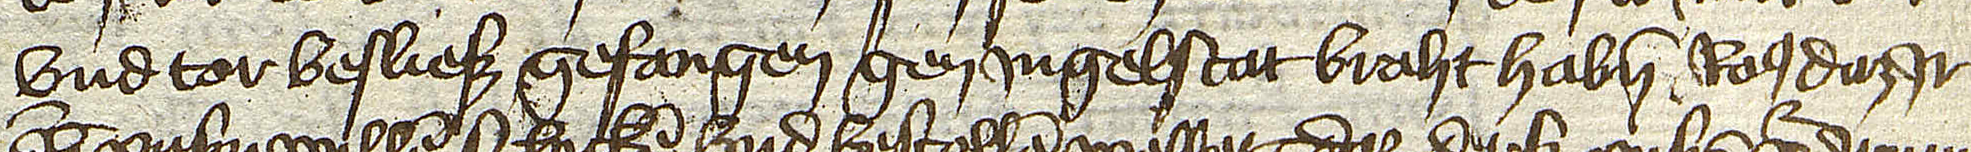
vnd tor beſlieſʒ gefangen gen Ingelſtat braht hab*n / Ro* daʒ Ir
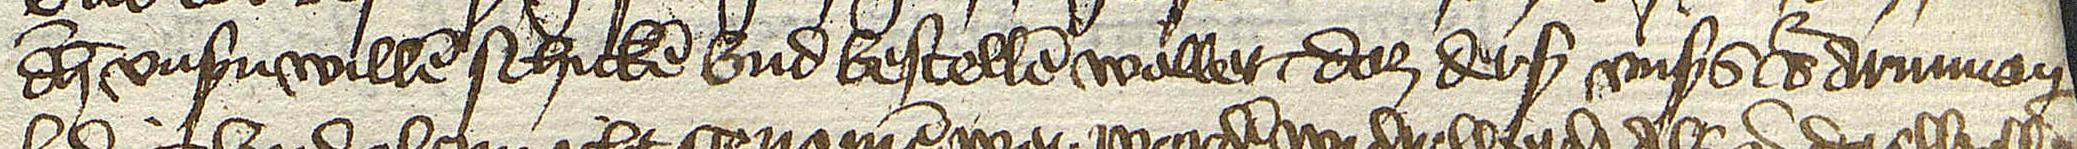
d*h* vnſ*n wille* ſchike* vnd beſtelle* wöllet / daʒ derſ* vnſ*s B* Armman
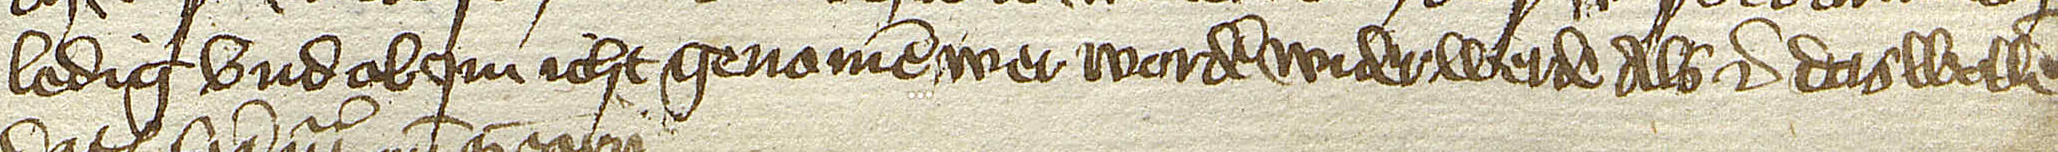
ledig vnd ob Im icht genome* wer word* wider werde Als ec* das wolle*
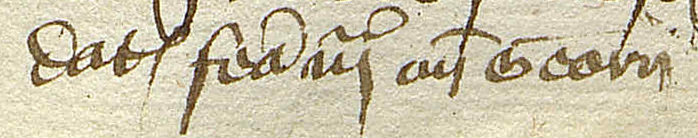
dat* fea* iii* an* Georii
